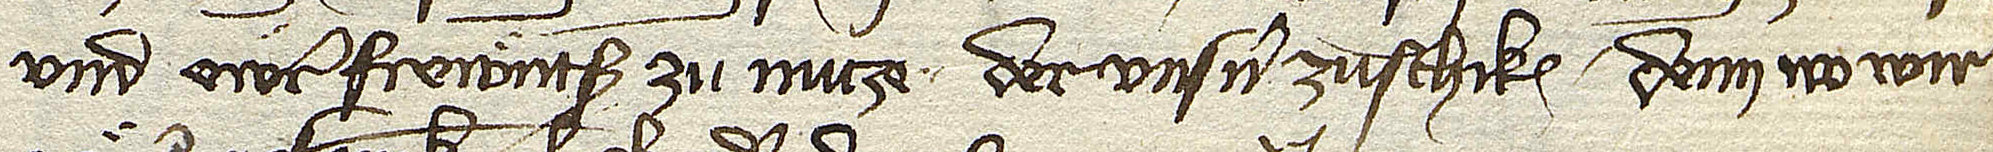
vnd ewr* frewntſ* ʒu nucʒe / der vnſn* ʒuſchik* / denn wo wir
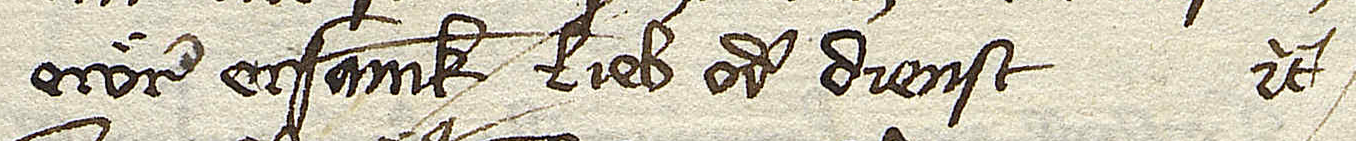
ewr* erſamk* lieb od* dienſt ec*
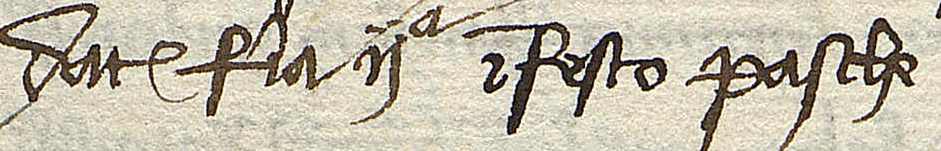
Dat* fia* ii* i* feſto Paſche
